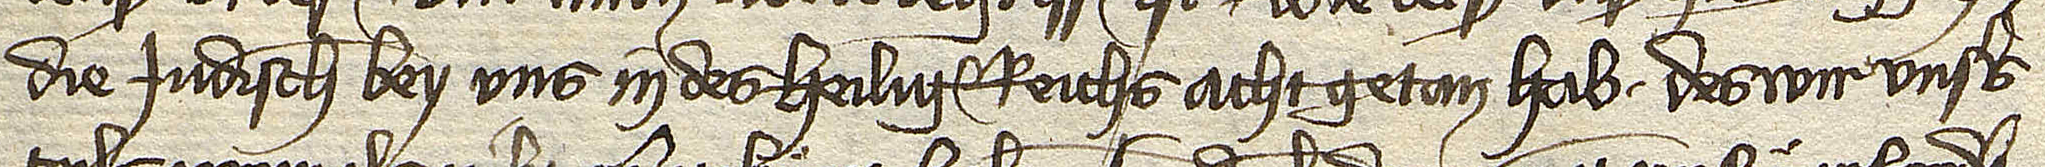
die Iudiſch* bey vns in des Heilig* Reichs acht getan hab / des wir vnſ*s
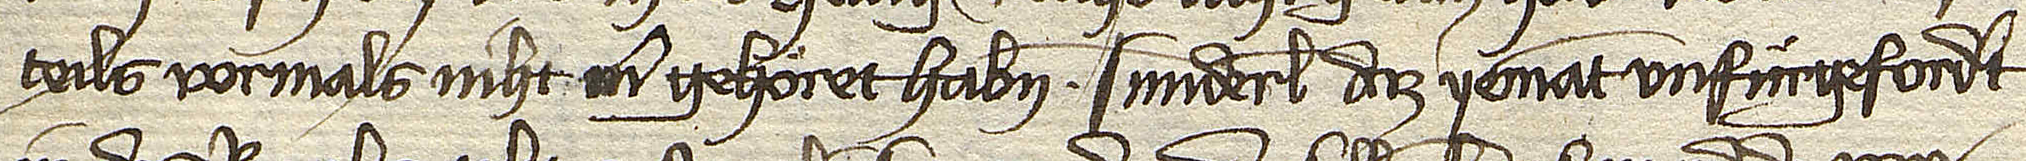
teils vormals niht m* gehöret habn* . ſunderl* daʒ yema*t vnfürgeford*t
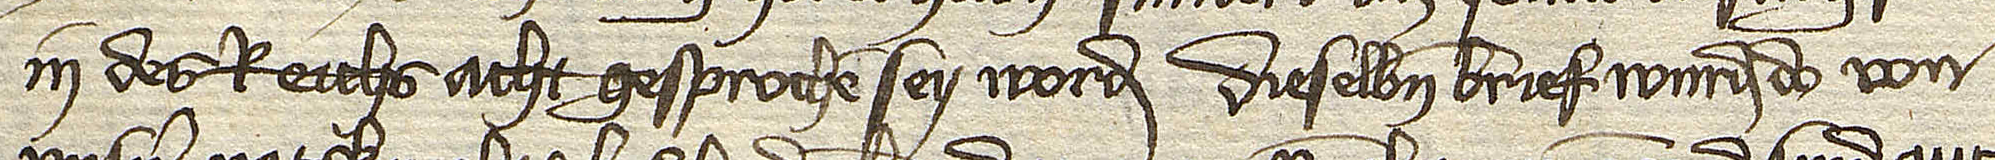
in des Reichs acht geſproche* ſey word* Dieſelbn* brief wurd* do von
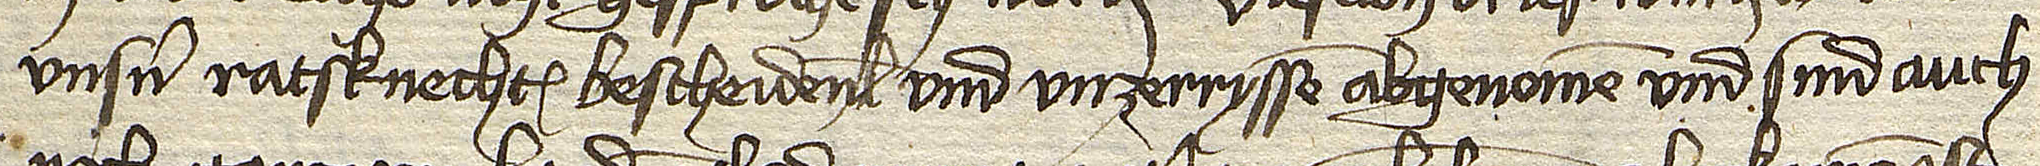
vnſn* ratſknecht* beſcheidenl* vnd vnʒerryſſe* abgenome* vnd ſind auch
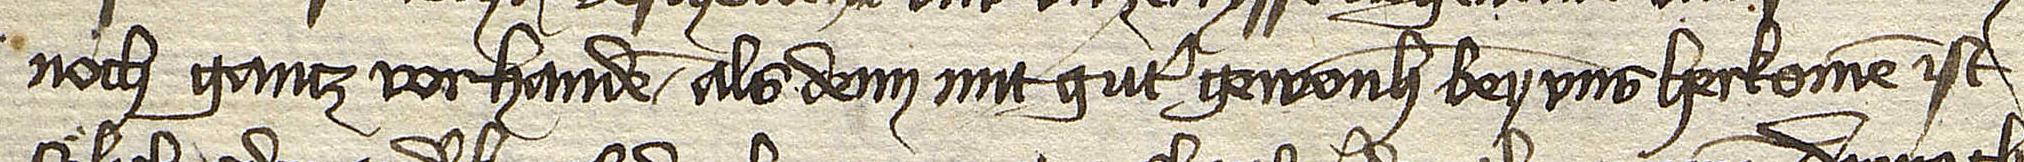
noch gancʒ vor hande* / als denn mit gut* gewonh* bey vns herkome* iſt
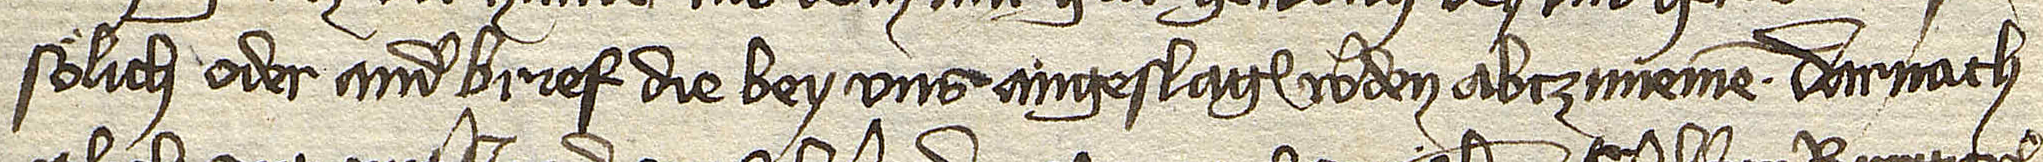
ſölich oder and* brief die bey vns angeſlag* w*den abcʒuneme* . Darnach
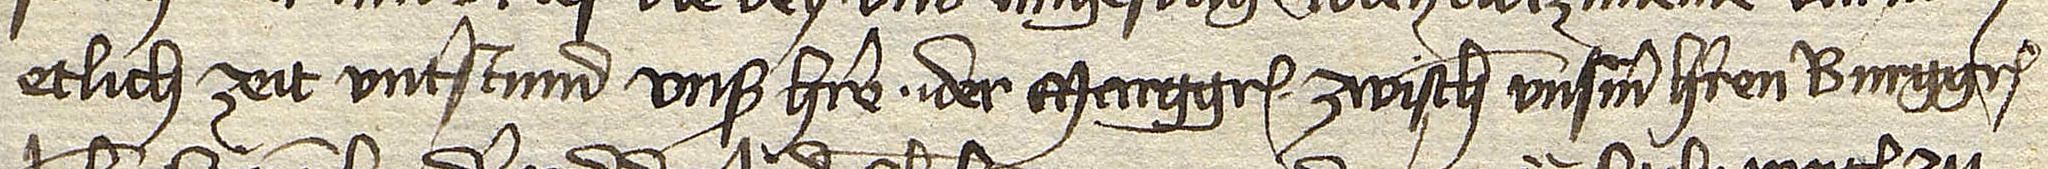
etlich ʒeit vnt*ſtund vnſ* h*re ~ der Marggr* . ʒwiſch* vnſm* h*ren Burggr*
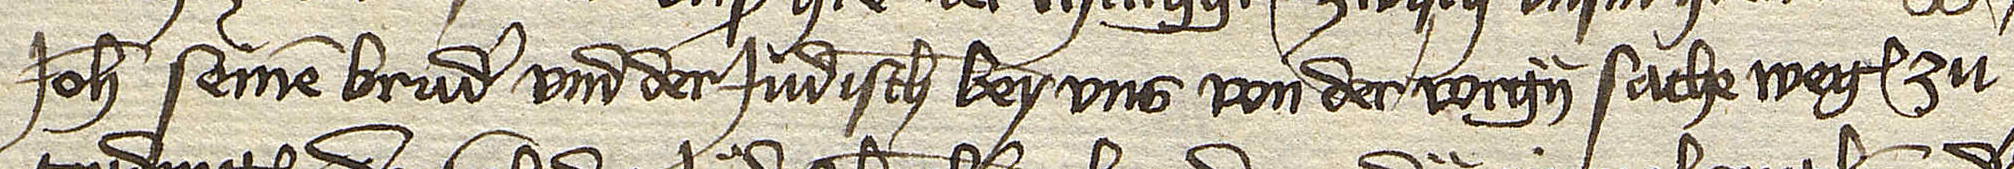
Ioh* ſeine* brud* vnd der Iüdiſch* bey vns von der vorgn* ſache weg* ʒu
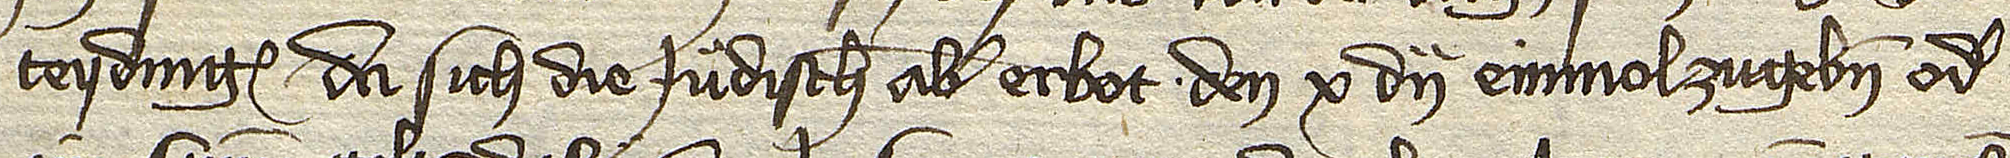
teyding* / Da ſich die Iüdiſch* ab* erbot . den x dn* einmal ʒugebn* od*
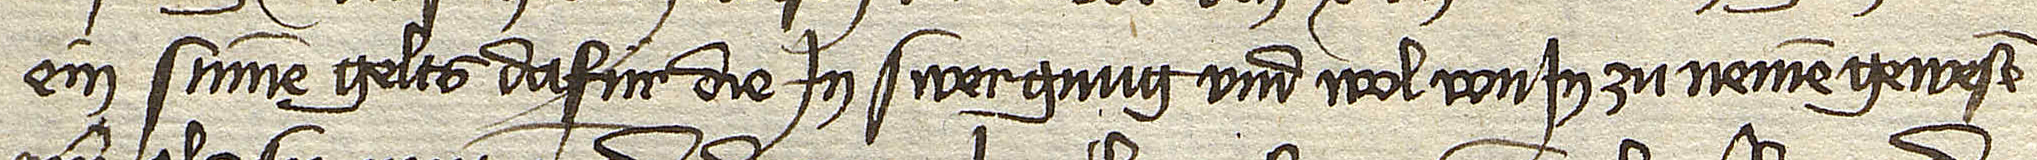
ein ſum*e gelts dafür die In ſwergnug vnd wol von In ʒu neme* geweſe*
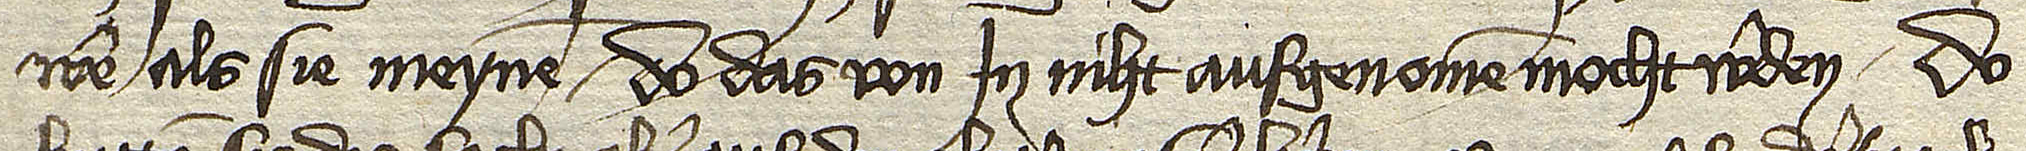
w*e als ſie meyne* / Do das von In niht aufgenome* mocht w*den / Do
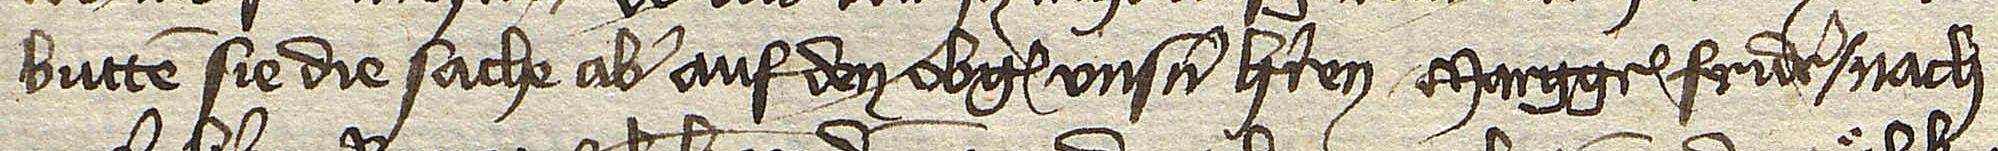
bitte* ſie die ſache ab* auf den obg* vnſn* h*ren / Marggr* fridr* / nach
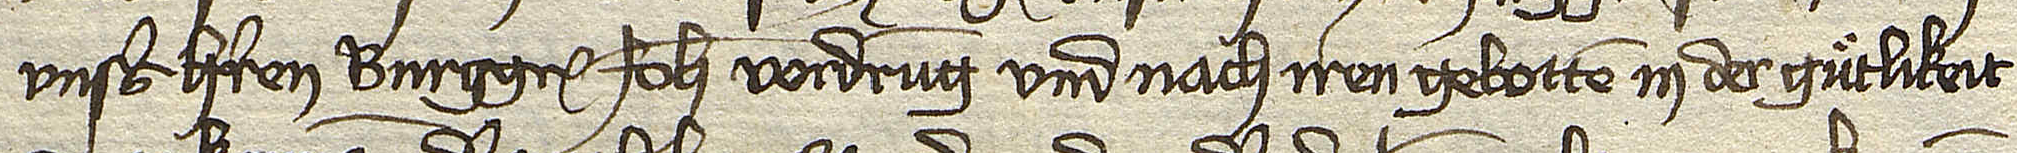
vnſ*s h*ren Burggr* Ioh* vordru*g vnd nach iren gebotte* in der gütlikeit
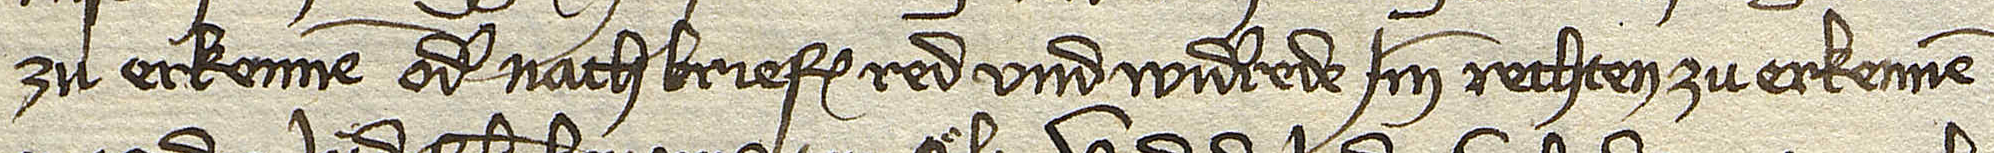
ʒu erkenne* od* nach brief* red vnd wid*rede Im* rechten ʒu erkenne*
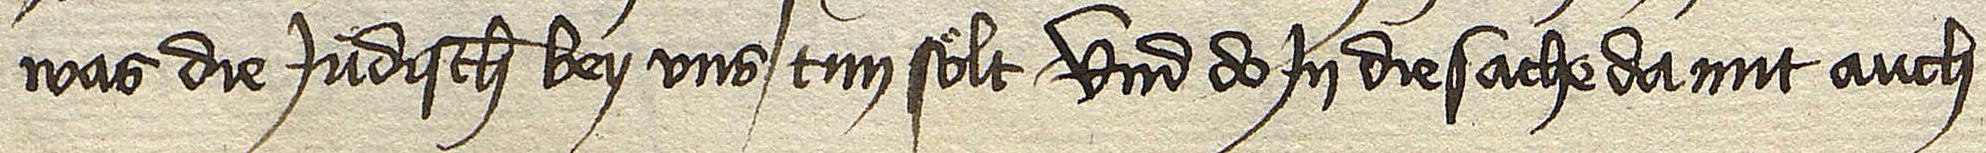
was die Iüdiſch* bey vns tun ſölt / Vnd do In die ſache da mit auch
